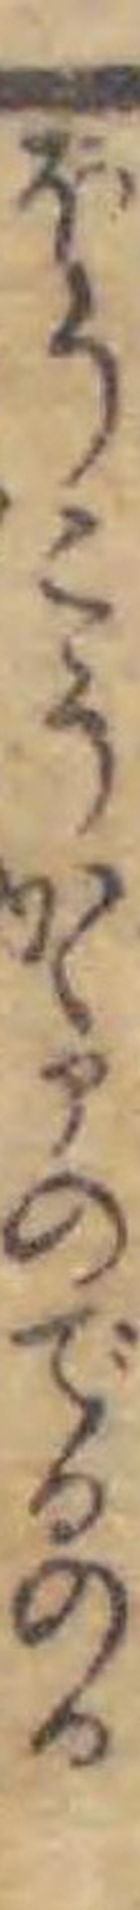ほうこうかゝ
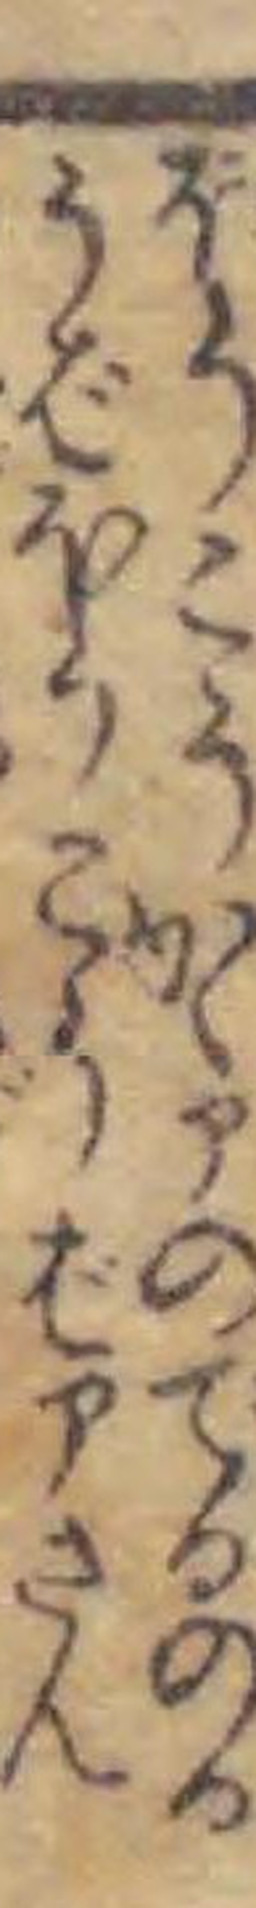うばほうこうば
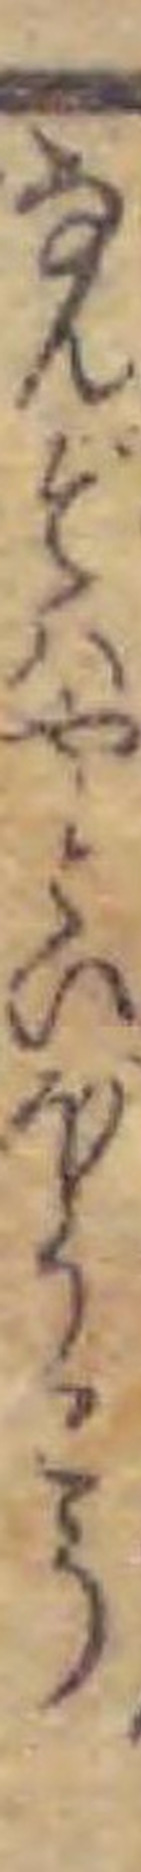なんぞはやといぼうこう
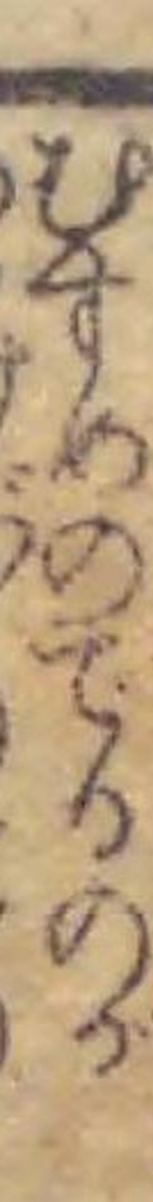むすめのてるのが
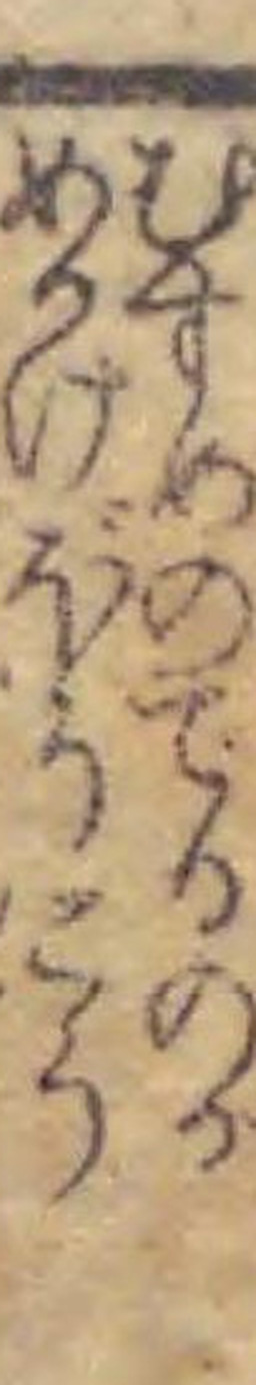めかけぼうこう
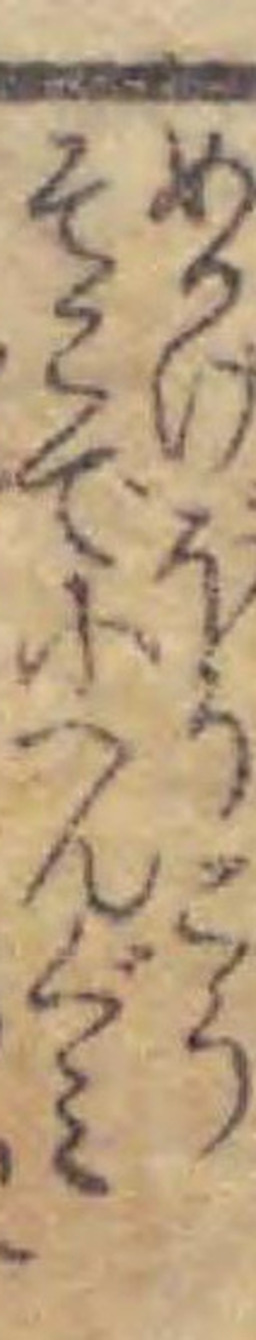そこで小へんぐみ
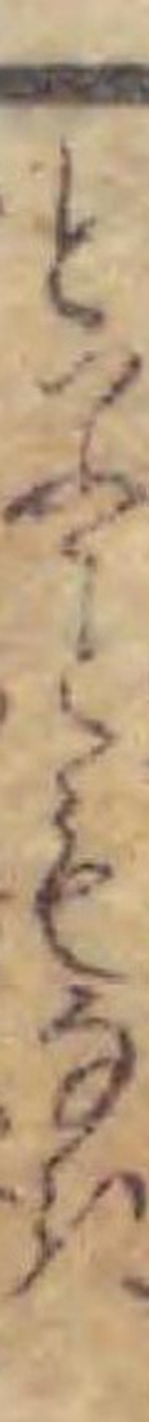といふこともなき
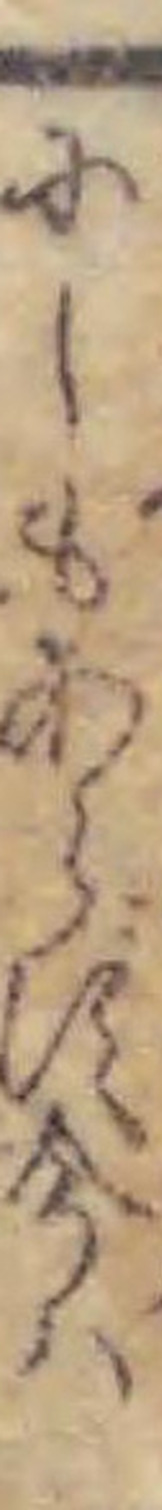にしもあらず今は
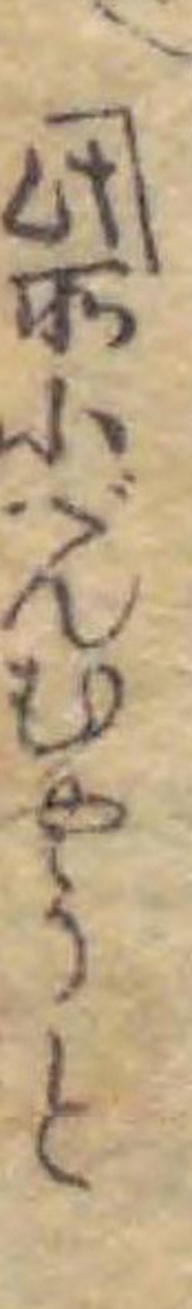〽此所小べんむやうと
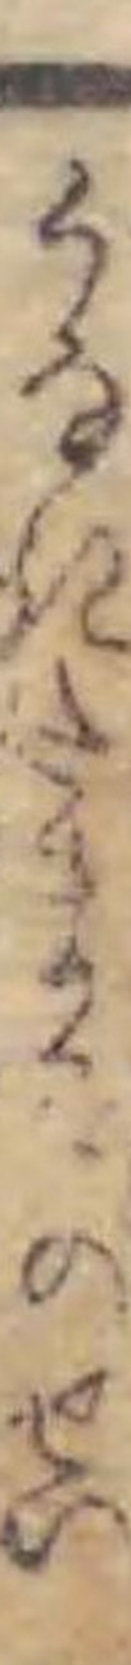うなきたまごのせい
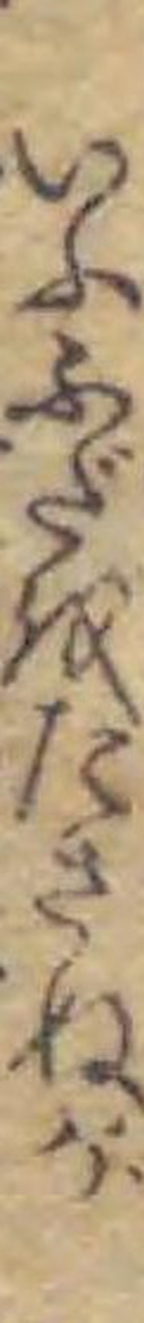いふふだをたさぬが
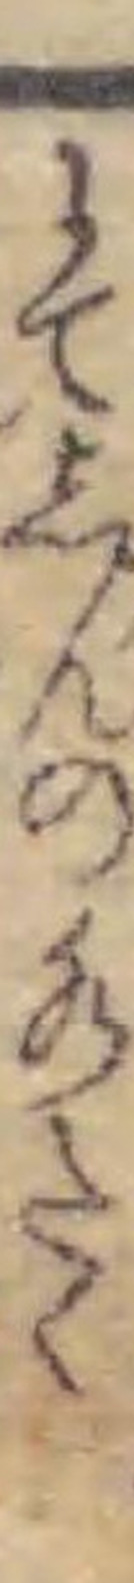にてしんの水たく
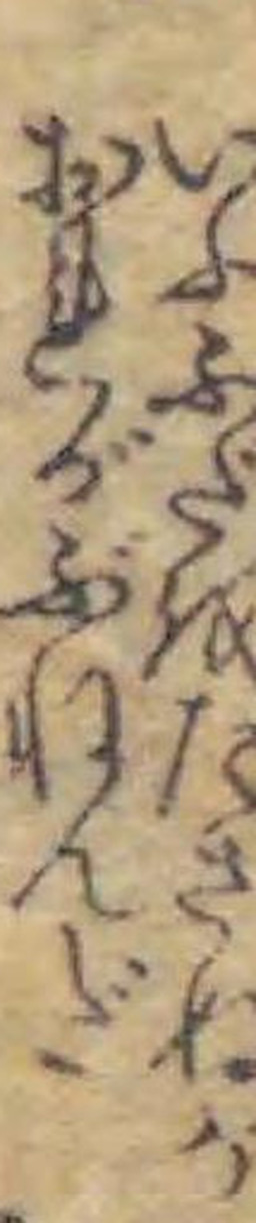おれがぶねんだ
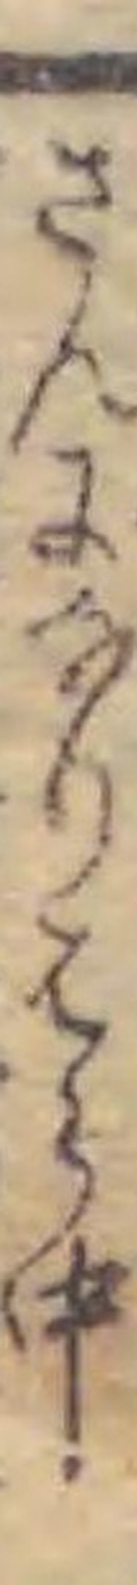さんになりはら中
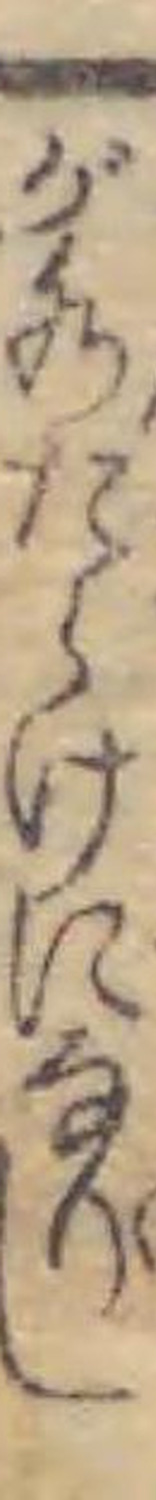が水たらけになりし
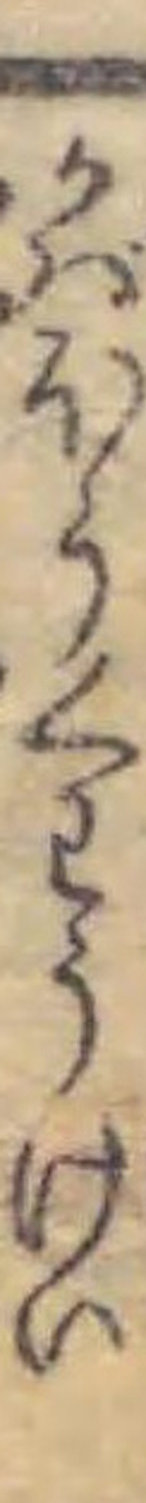かばほうくわうけい
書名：十四傾城腹之内 : 3巻
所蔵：国立国会図書館 National Diet Library, JAPAN
